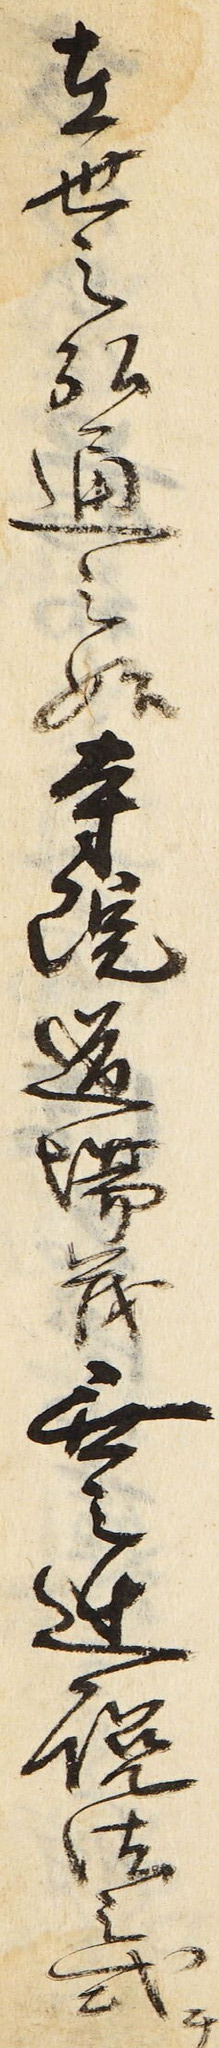在世之弘通之始寺院道場も無之辻説法之式ヲ

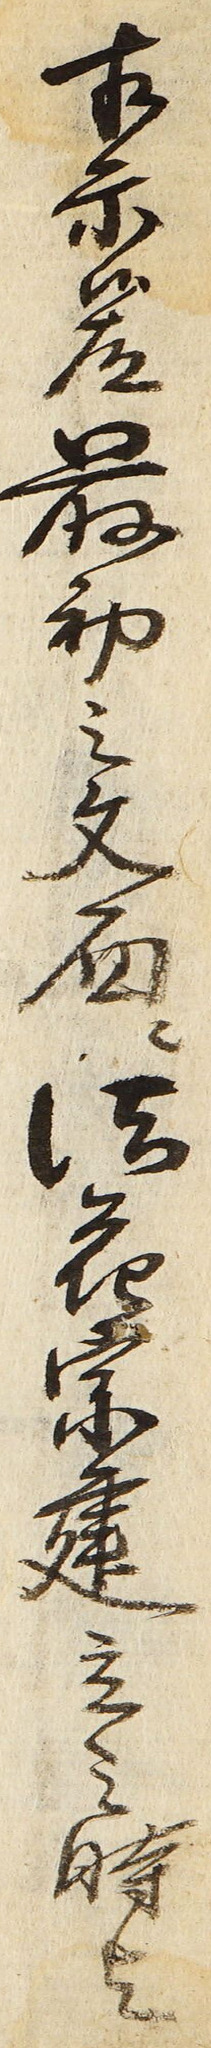相示候故最初之文面に法花宗建立之時は
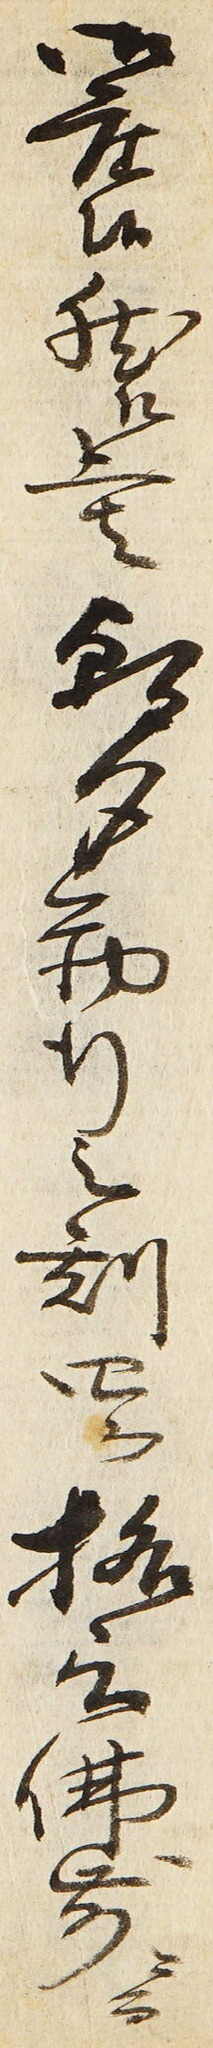御座候然る上は朝夕勤行之刻四ケ格言仏前に而
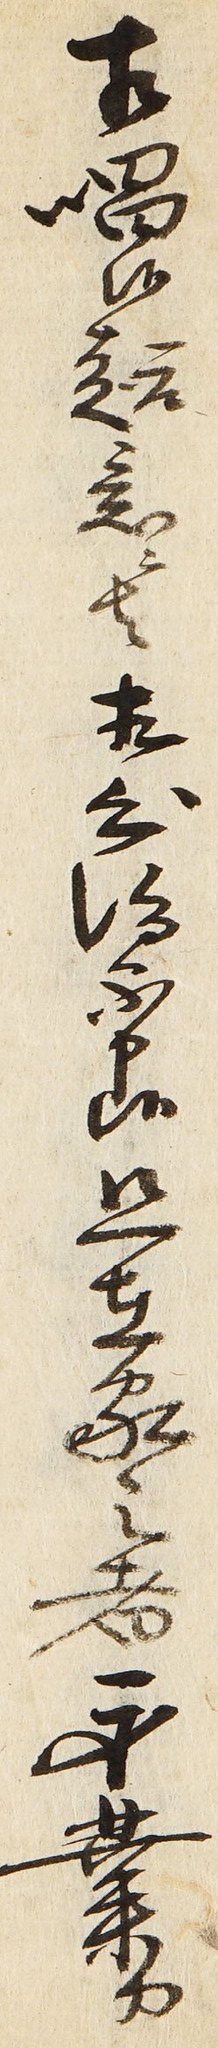相唱候趣意には相心得不申候且在家之者身業か
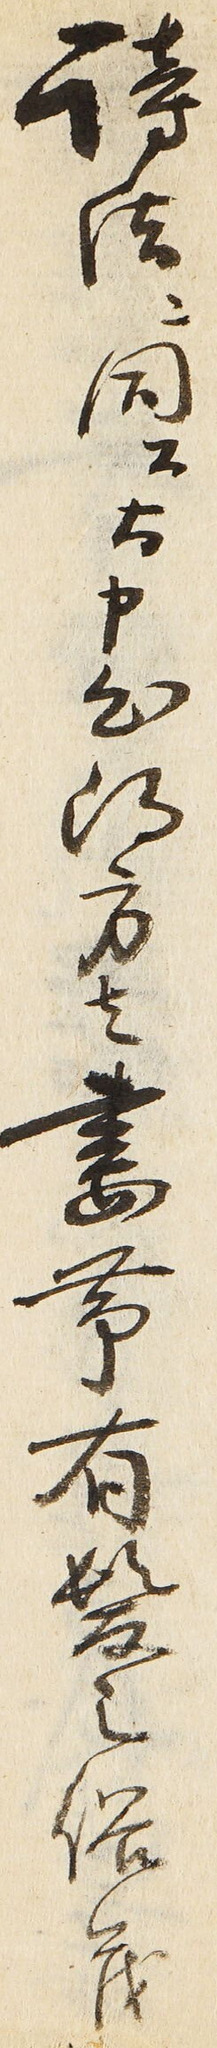謗法に同すと申心得方は妻帯有髪之俗も
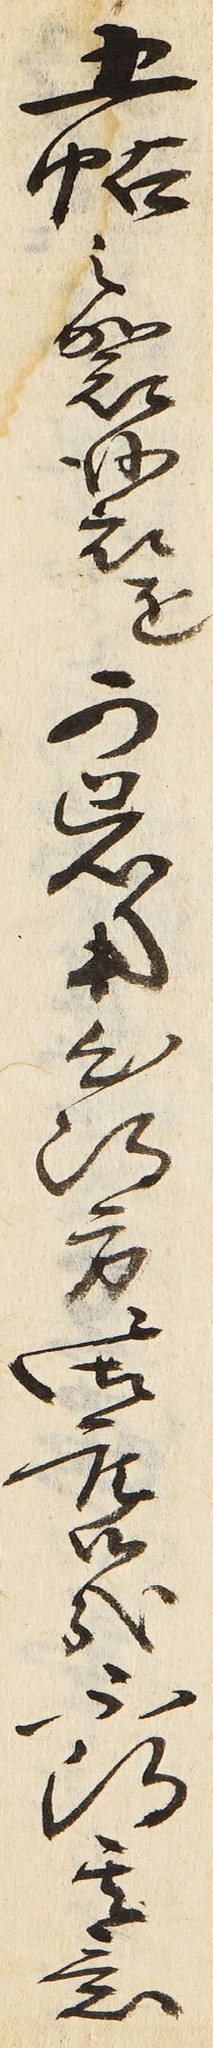五帖之袈裟を可着用心得方に御座候哉不得其意
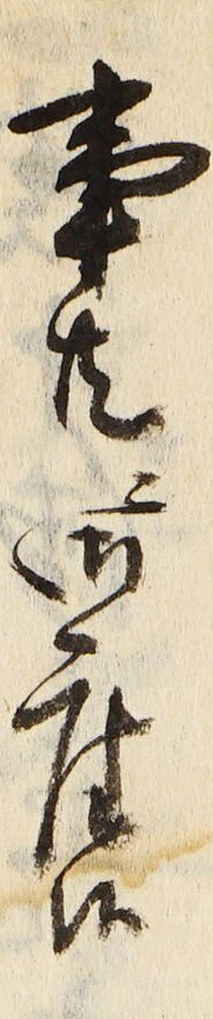事共に御座候
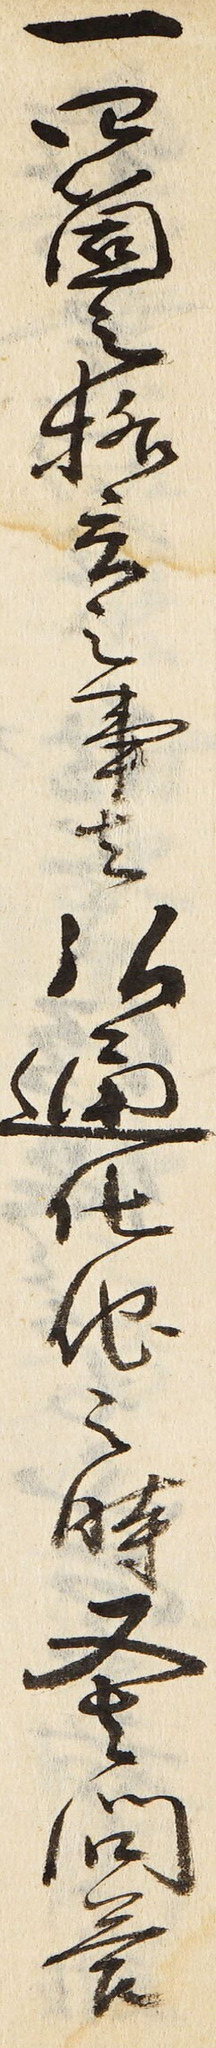一四箇之格言之事は弘通化他之時又は問答
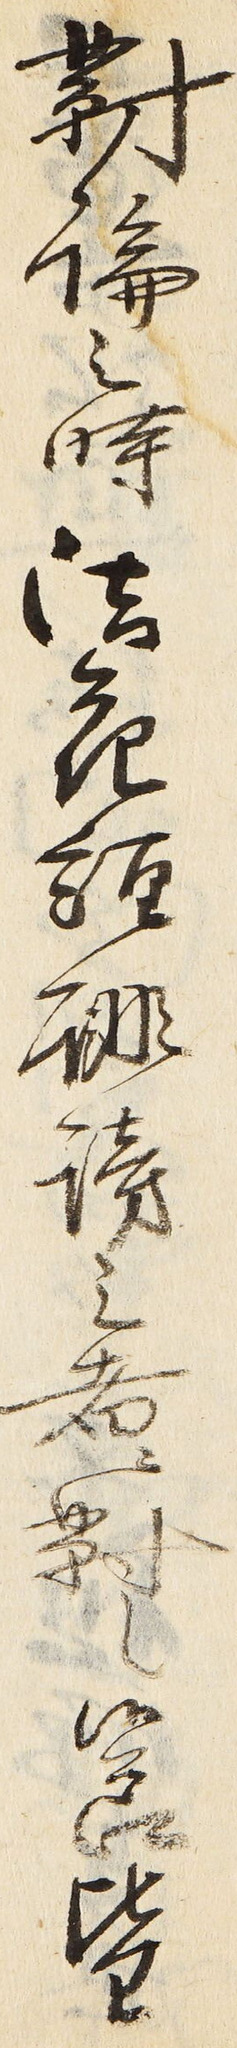対論之時法花経誂謗之者に対し候節皆
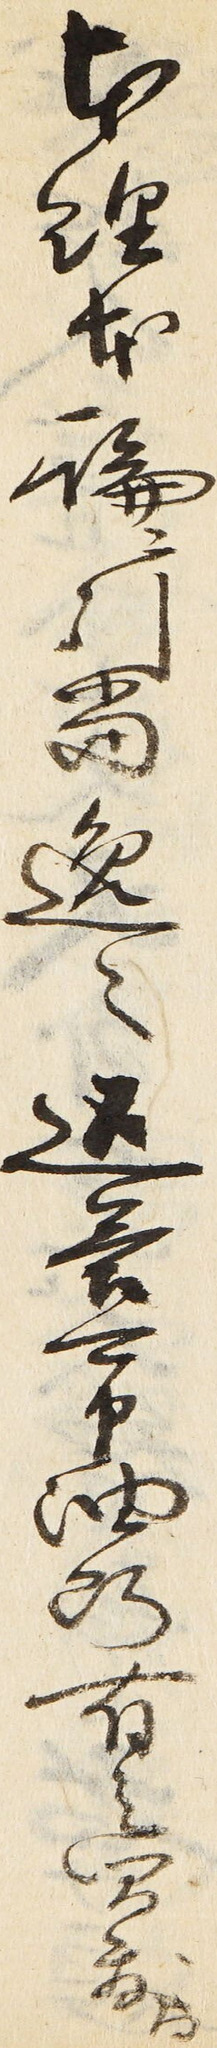本理本論に引当逸々返答可申油断有之間敷と
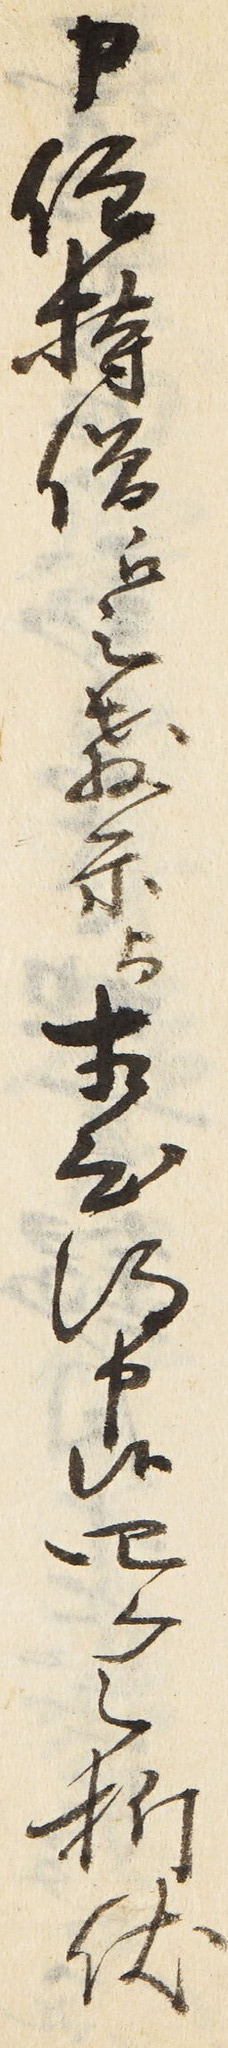申住持僧え之教示と相心得申候四ケ之折伏
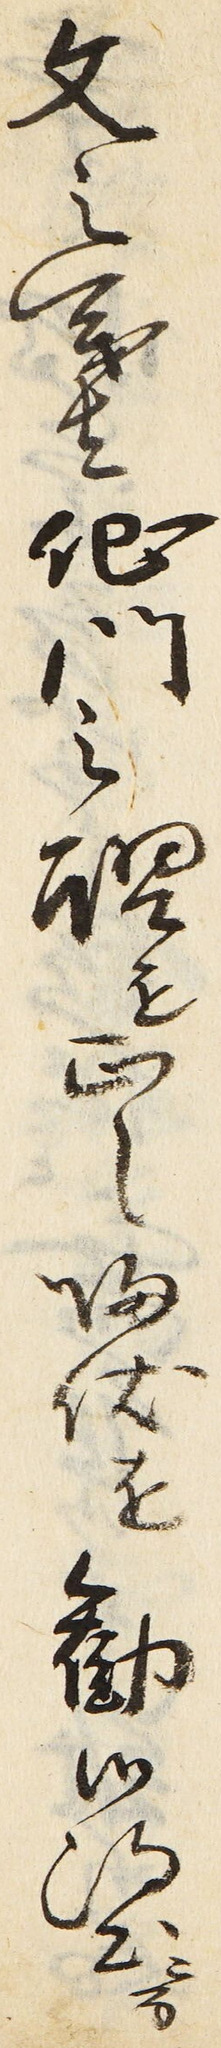文之義は他門之謬を正し帰伏を勧候得心に而
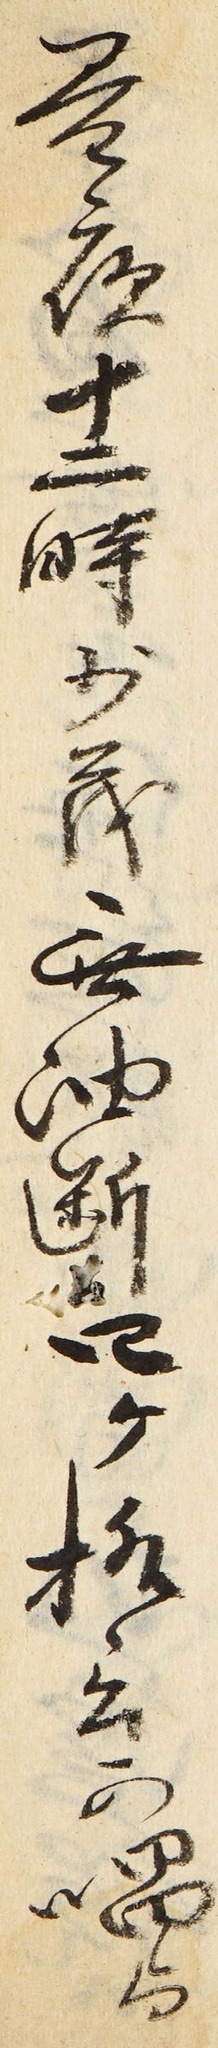昼夜十二時少も無油断為四ケ格言可唱と

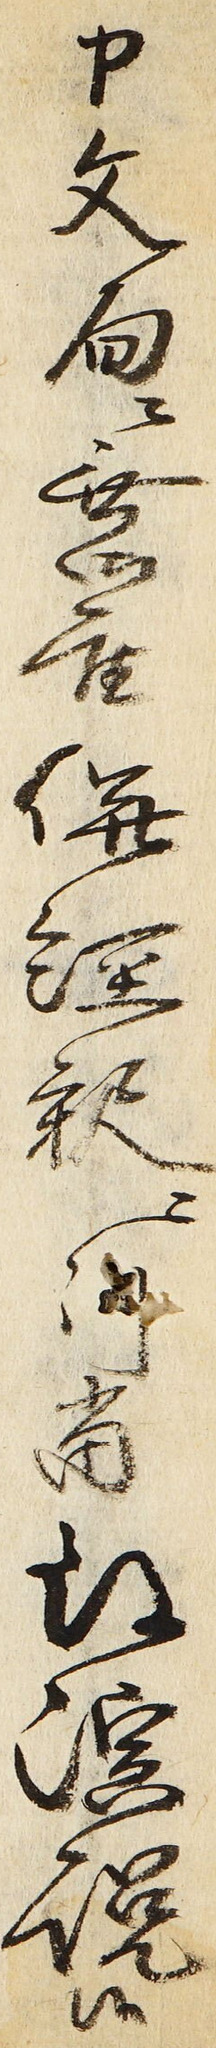申文面に無御座併経釈に御当致演説候
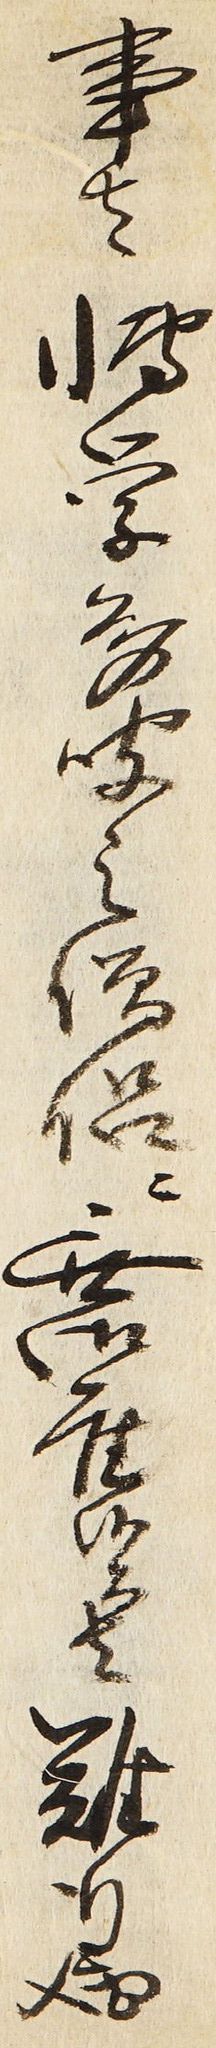事は博学多聞之僧侶に無御座候而は難行届
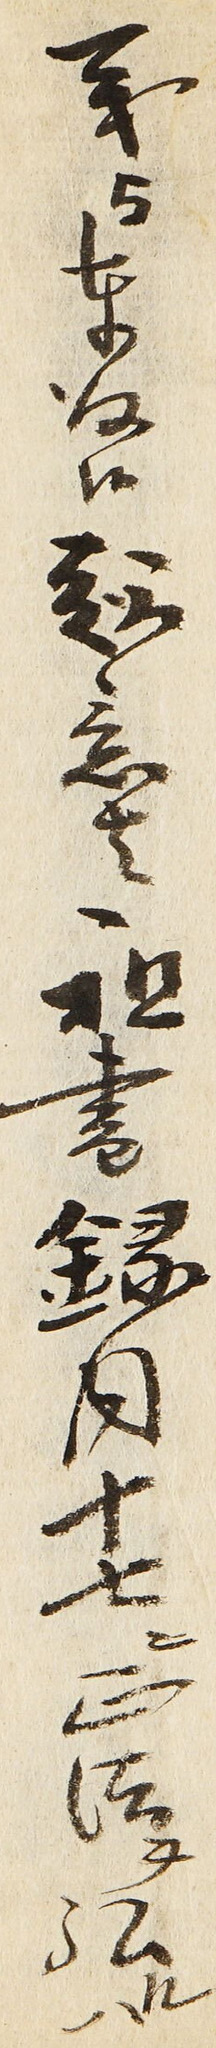義と奉存候趣意は祖書録内十七に正法ヲ弘ルハ
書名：異流一件日記
